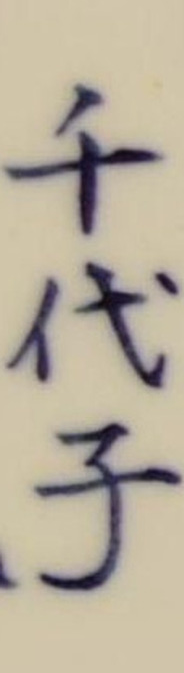千代子
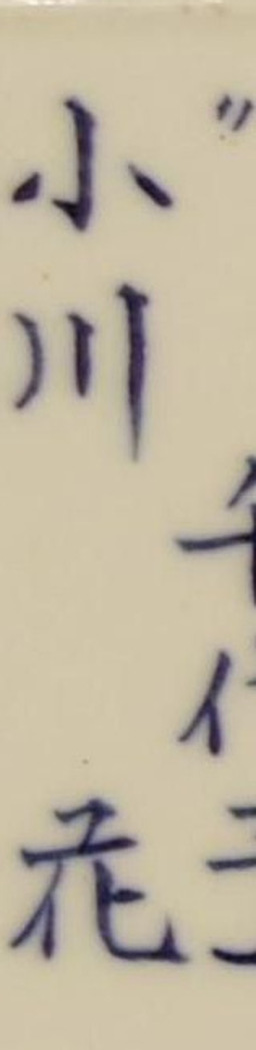小川花

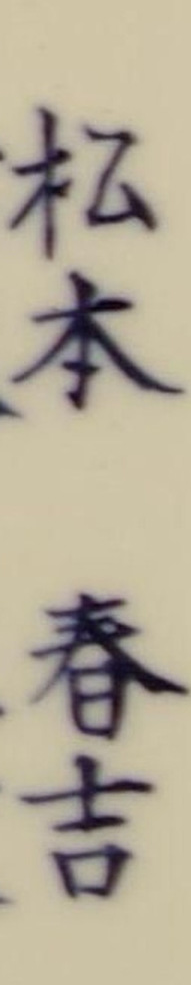松本春吉
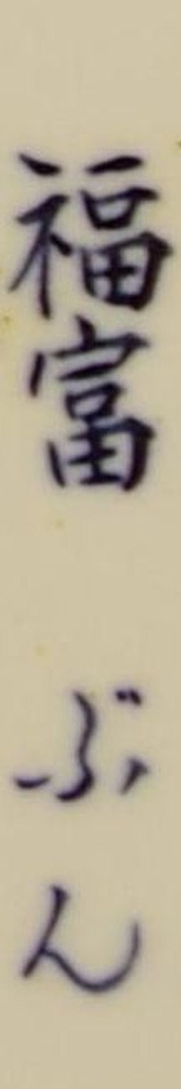福富ぶん
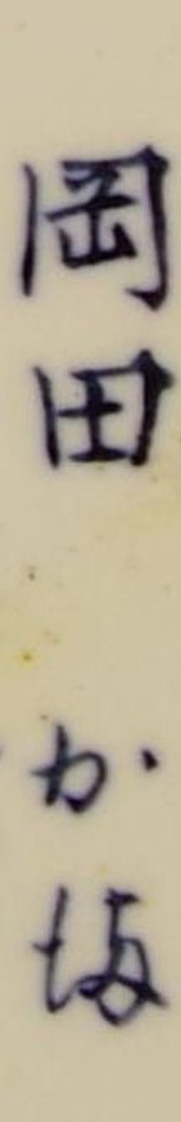岡田かま
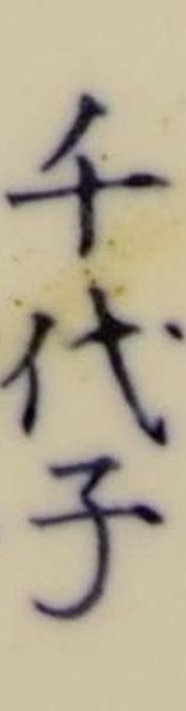千代子
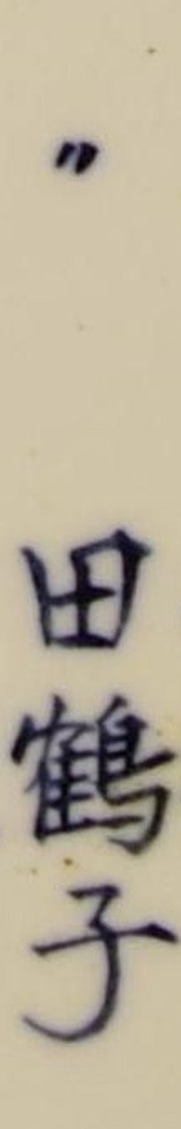田鶴子
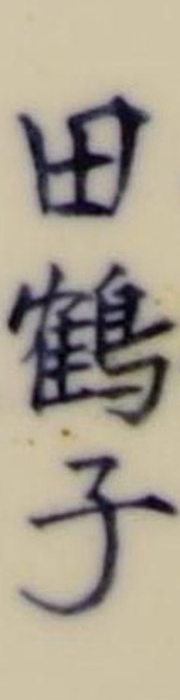田鶴子
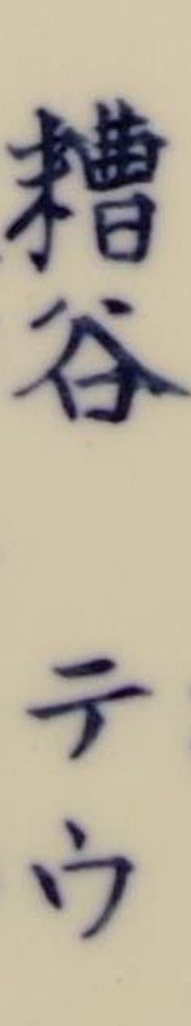糟谷テウ
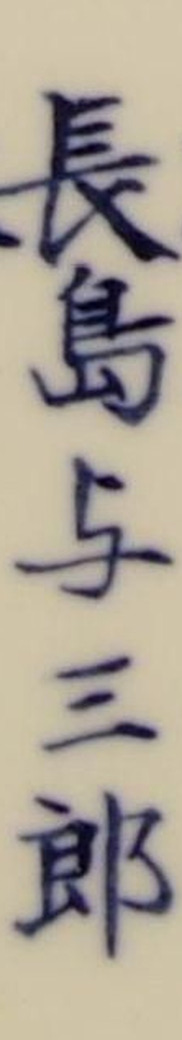長島与三郎
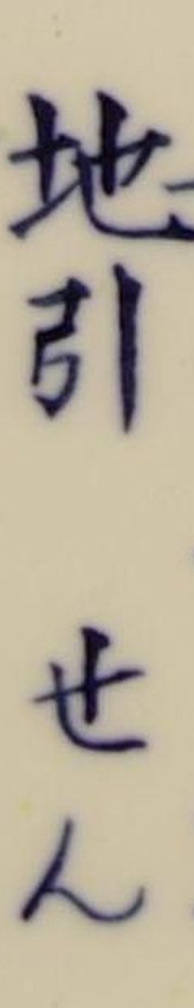地引せん
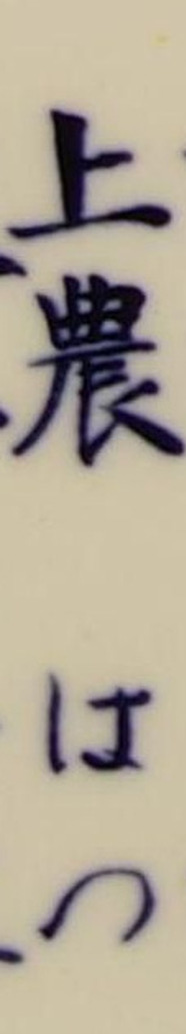上農はつ
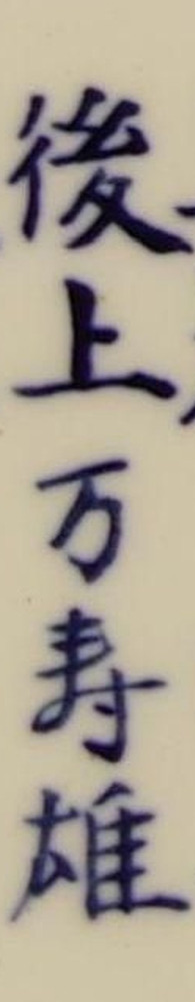後上万寿雄
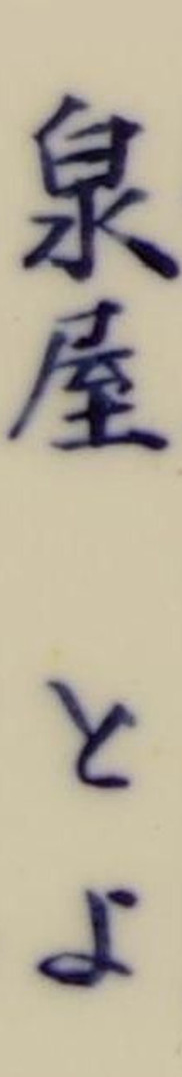泉屋とよ
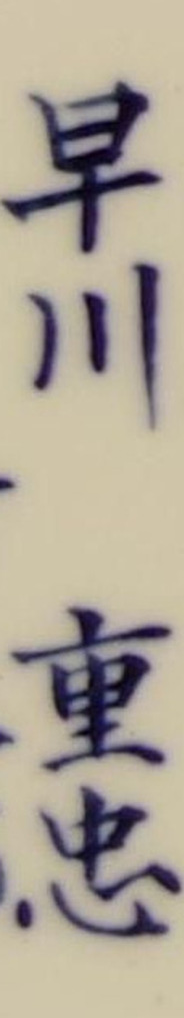早川重忠
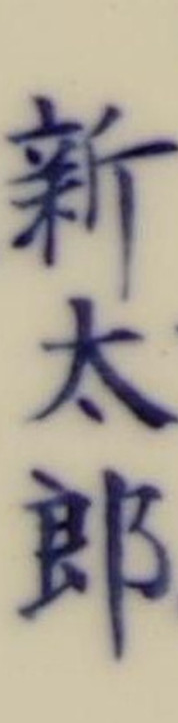新太郎
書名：E~L
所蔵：高野山金剛峯寺
